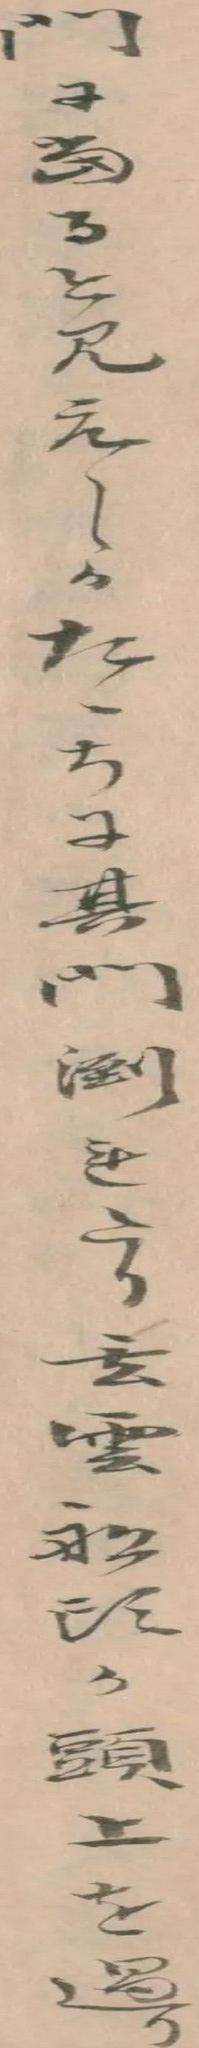門に当ると見えしかたゝちに其門倒れたり玄雲船頭か頭上を過り
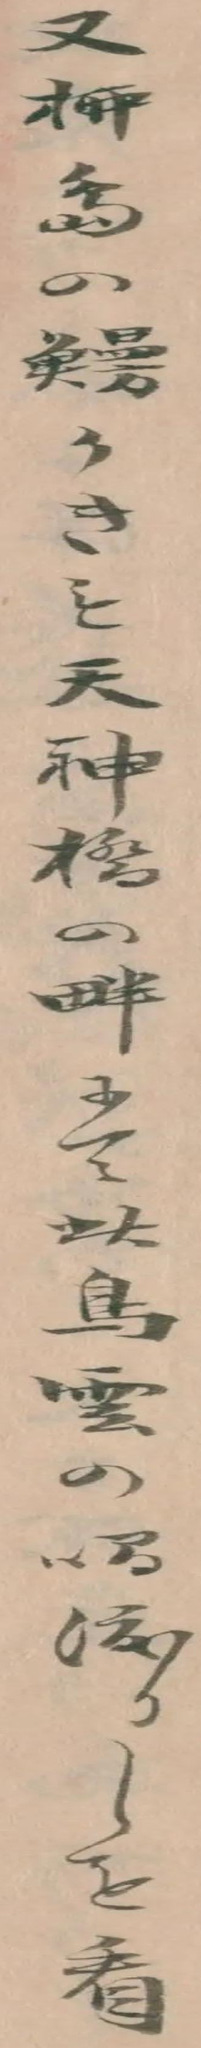又柳島の鰻かきも天神橋の畔にて此鳥雲の鳴渡りしを看
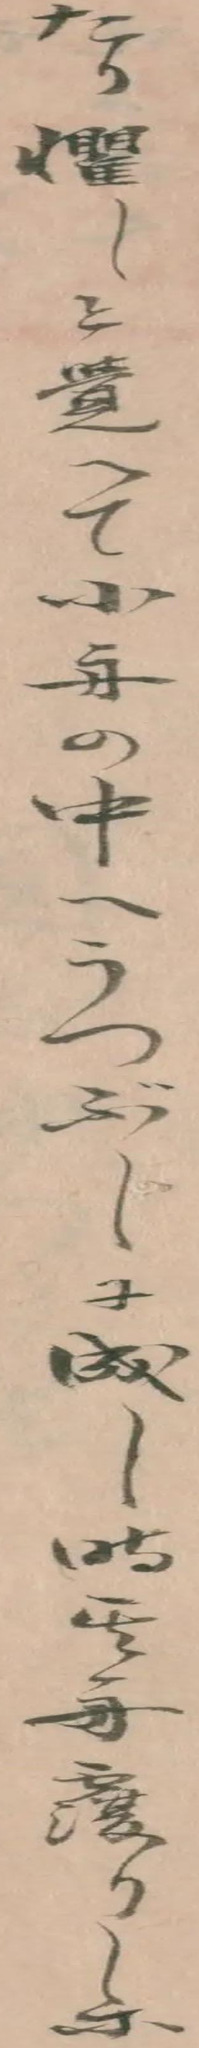たり懼しと覚へて小舟の中へうつぶしに成し時其舟覆りしに
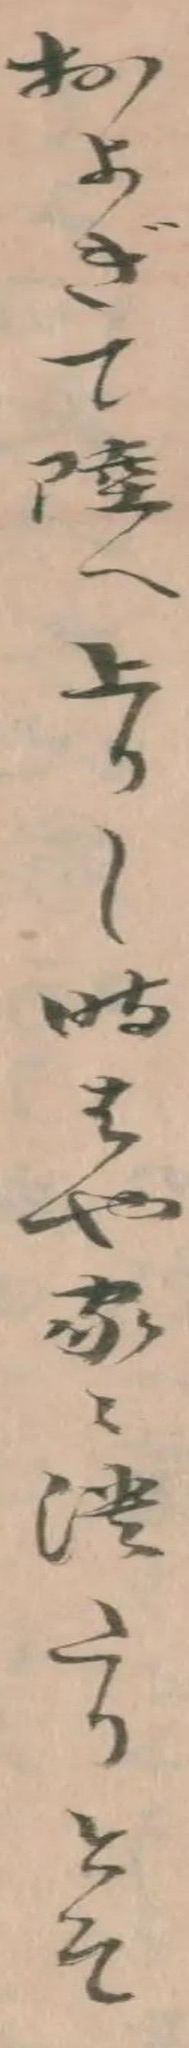およぎて陸へ上りし時はや家々潰たりとそ
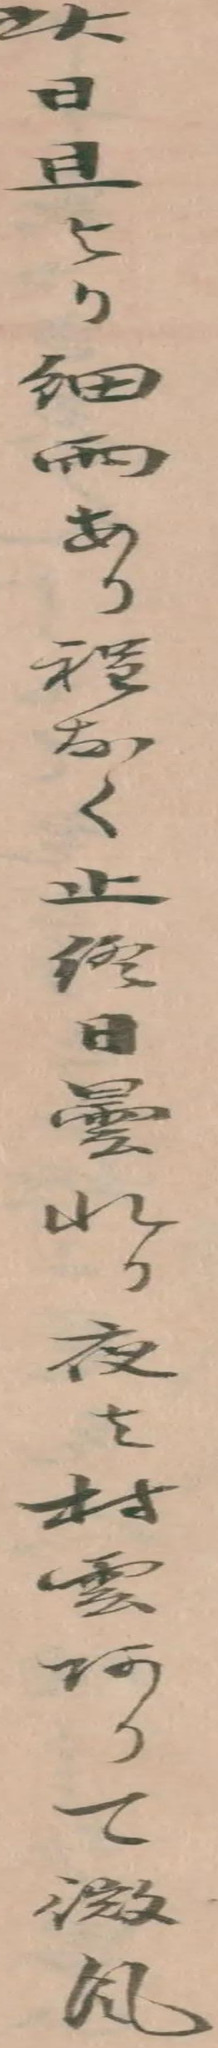此日旦より細雨あり程なく止終日曇れり夜は村雲ありて微風
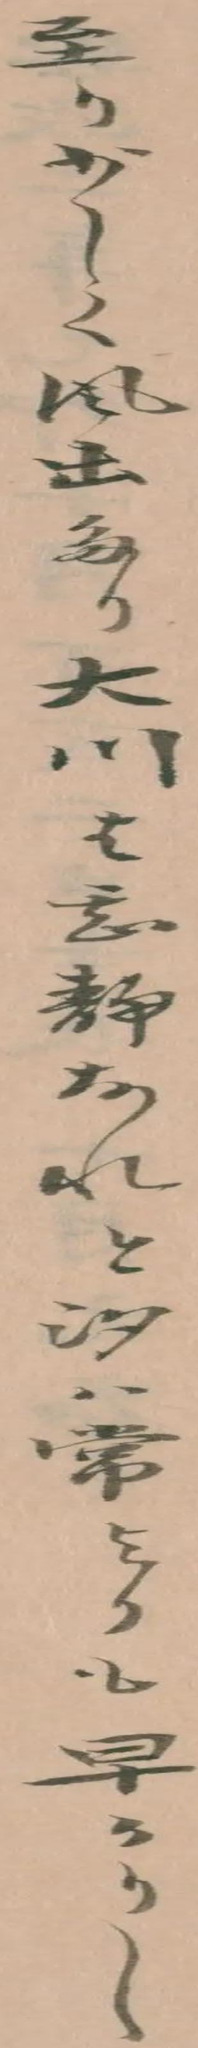至り少しく風出たり大川は甚静なれと汐ハ常よりも早かりし
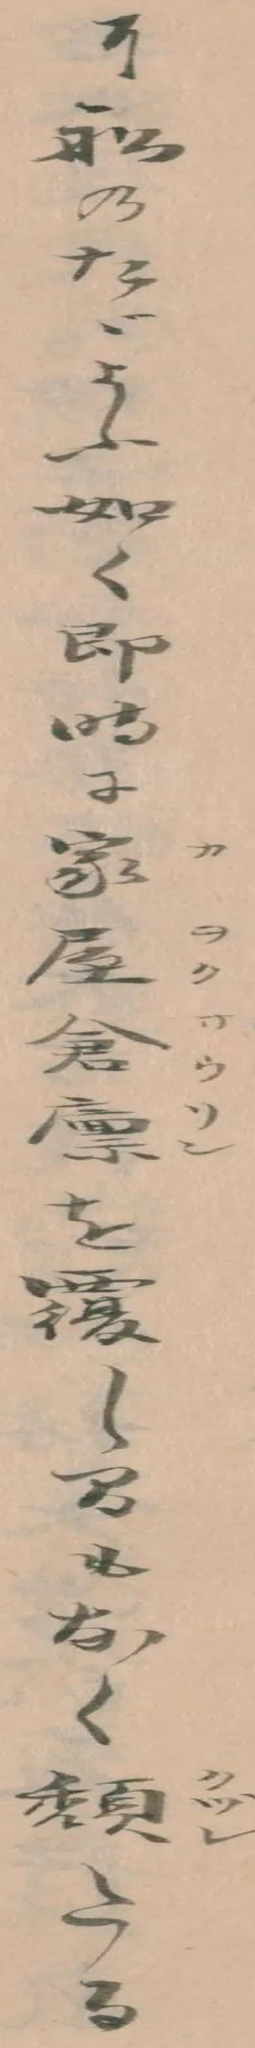に船のたゞよふ如く即時に家屋倉廩を覆し間もなく頽たる
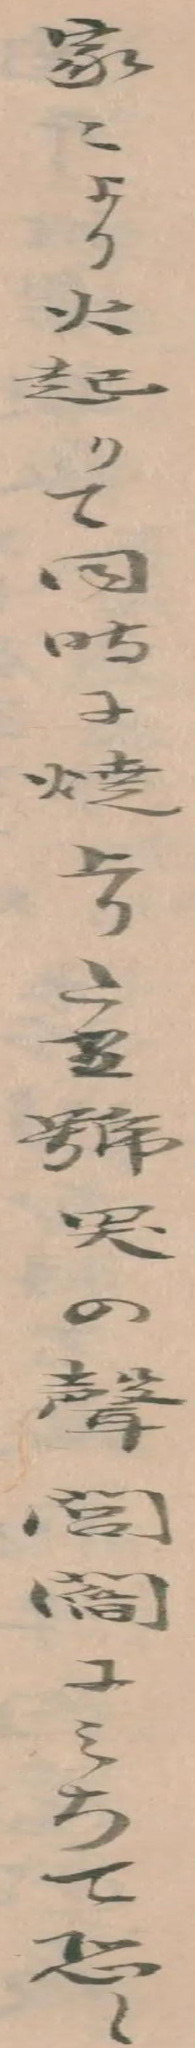家々より火起りて同時に焼上リたり号哭の声閭閻にみちて恐し
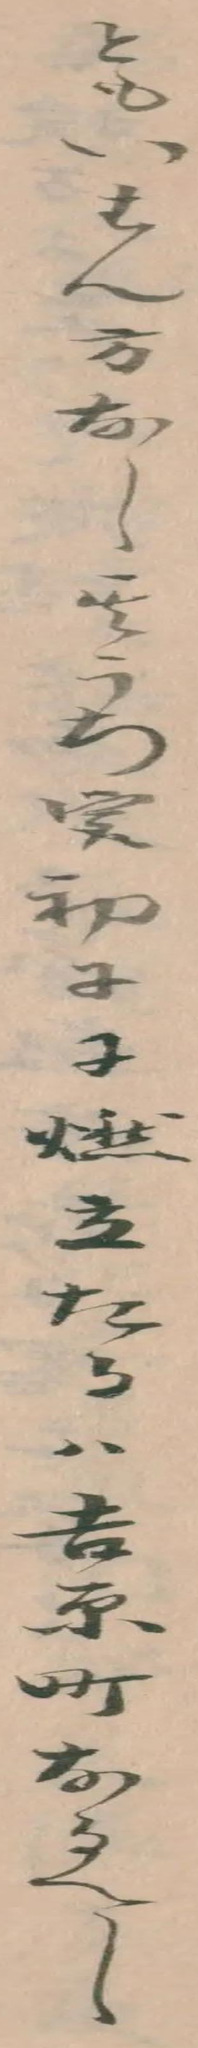ともいはん方なし其内最初にに燃立たるは吉原町なるへし
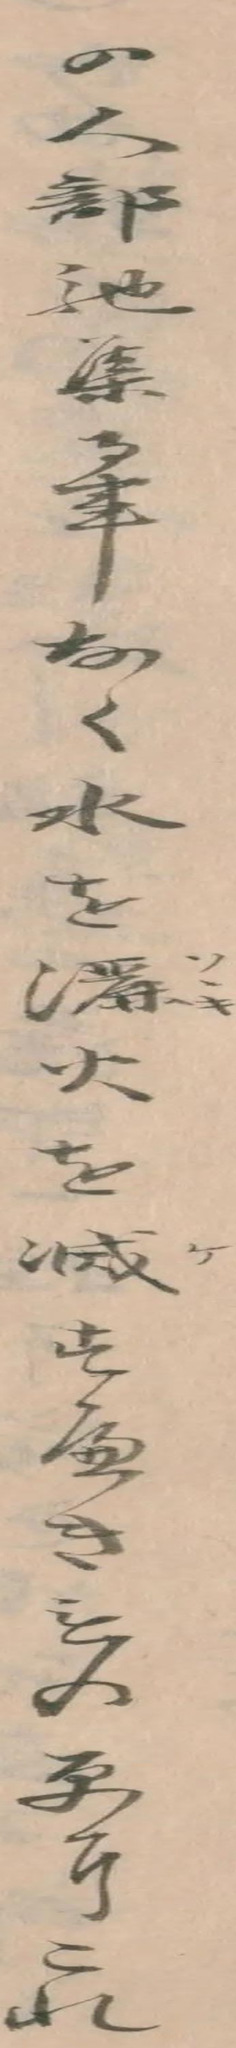の人部馳集る事なく水を灌火を滅すへきもの更にこれ
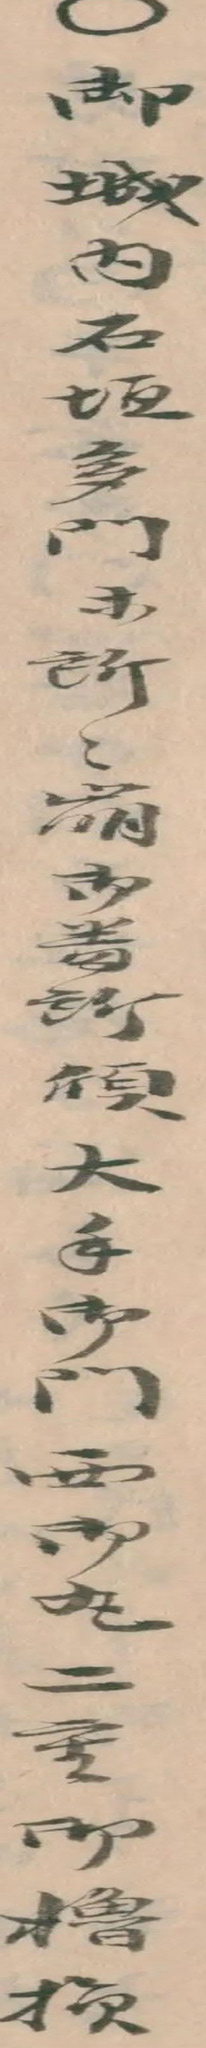〇御城内石垣多門等所々崩御番所傾大手御門西御丸二重御櫓損
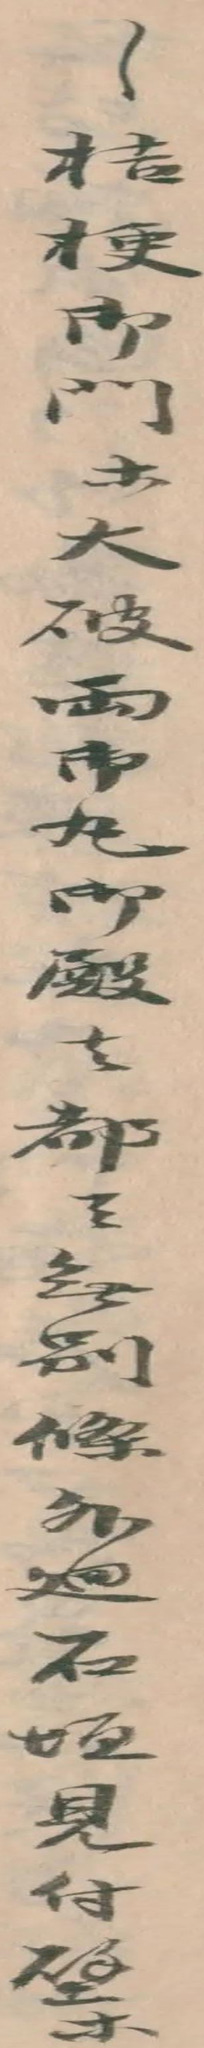し桔梗御門等大破両御丸御殿は都て無別条外廻石垣見付壁等

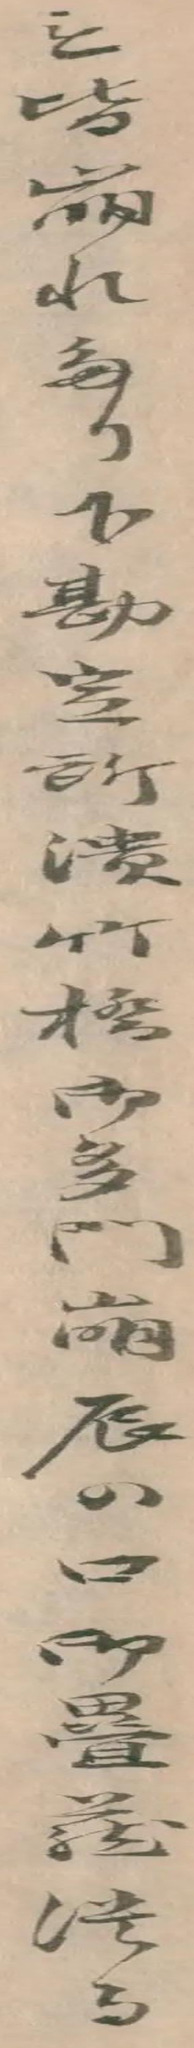も皆崩れたり下勘定所潰竹櫓御多門崩辰の口御畳蔵潰る
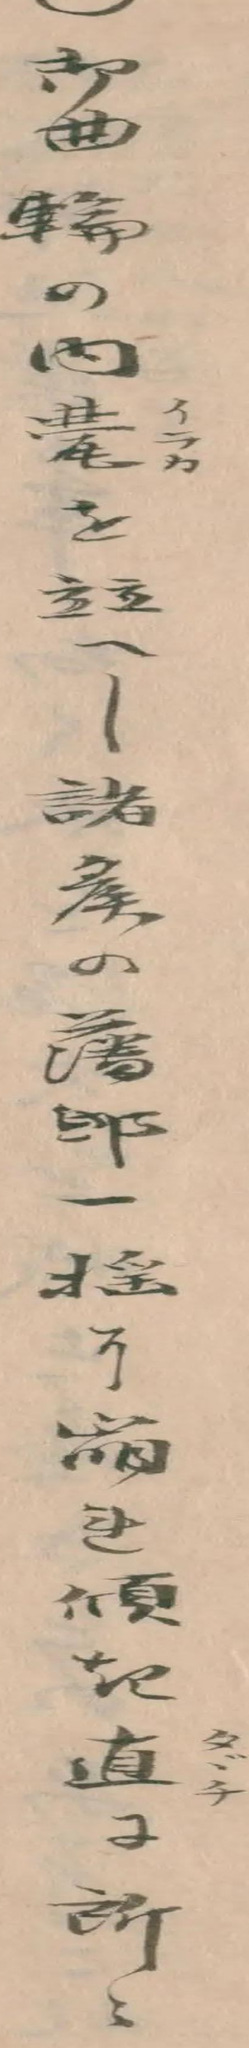〇御曲輪の内甍を並へし諸侯の藩邸一揺に崩れ傾き直に所々
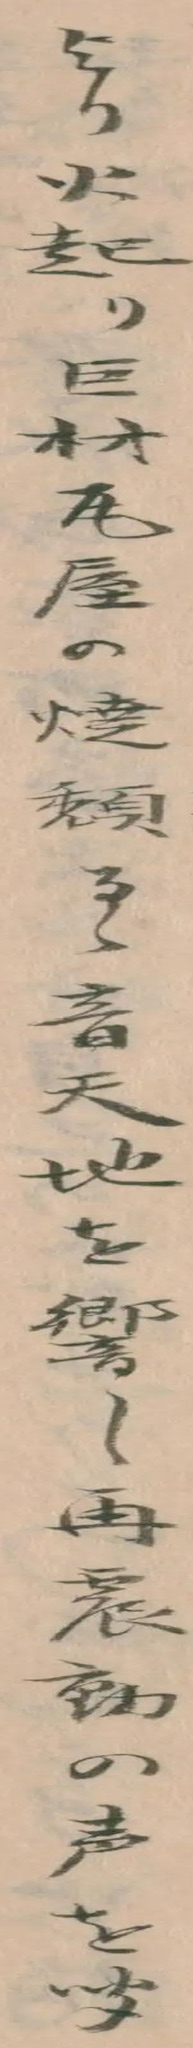より火起り巨材瓦屋の焼頽るゝ音天地を響し再震動の声を聞
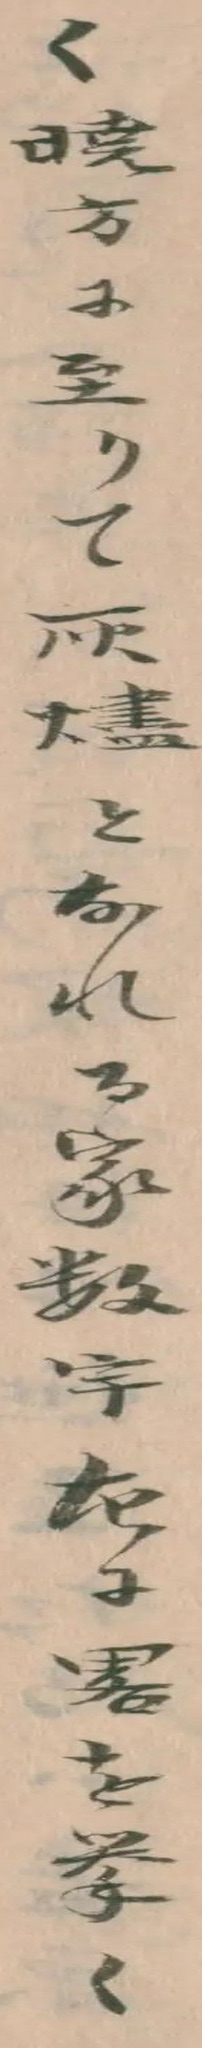く暁方に至りて灰燼となれる家数宇左に畧を挙く
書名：地災撮要. 巻7-9(地震之部)
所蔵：国立国会図書館 National Diet Library, JAPAN
